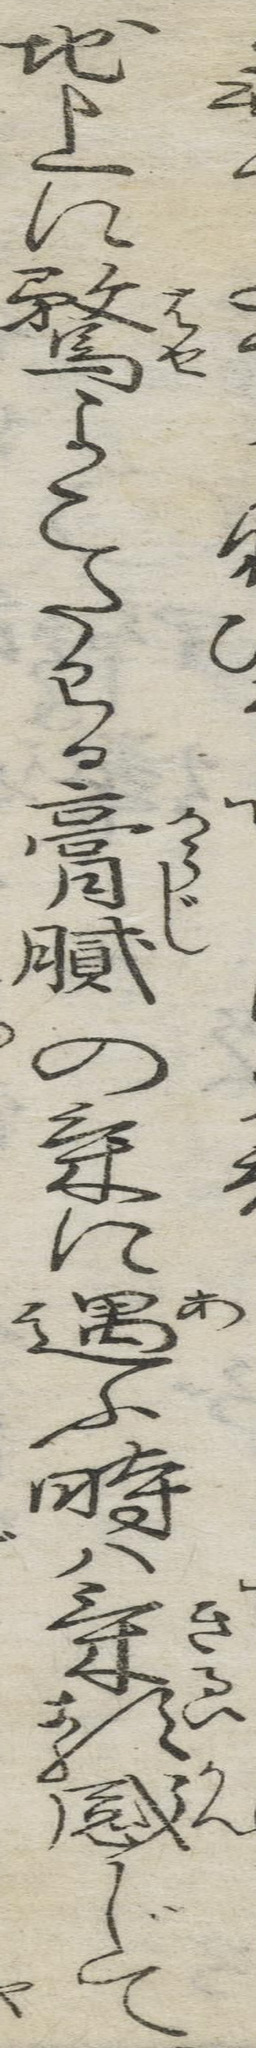地上に騖にこたわる膏膩の気に遇ふ時は気類感じて
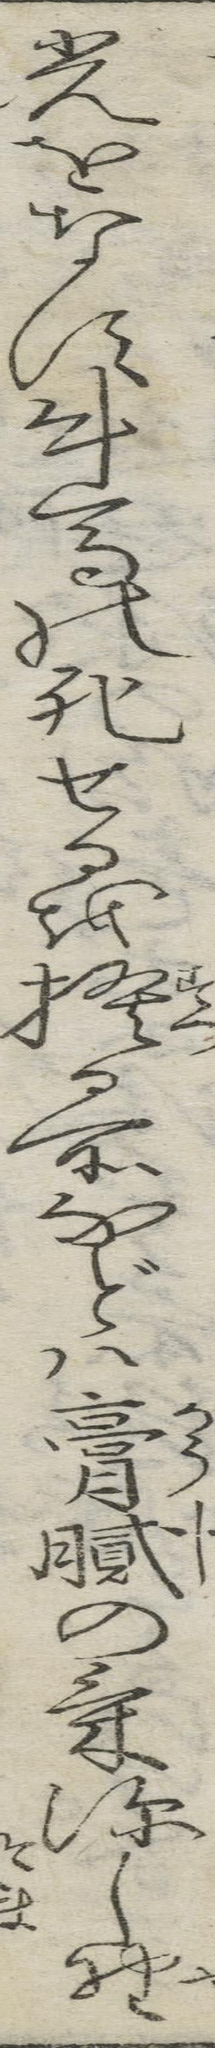光をなす牛馬の死せるを捨る所などは膏膩の気深く野
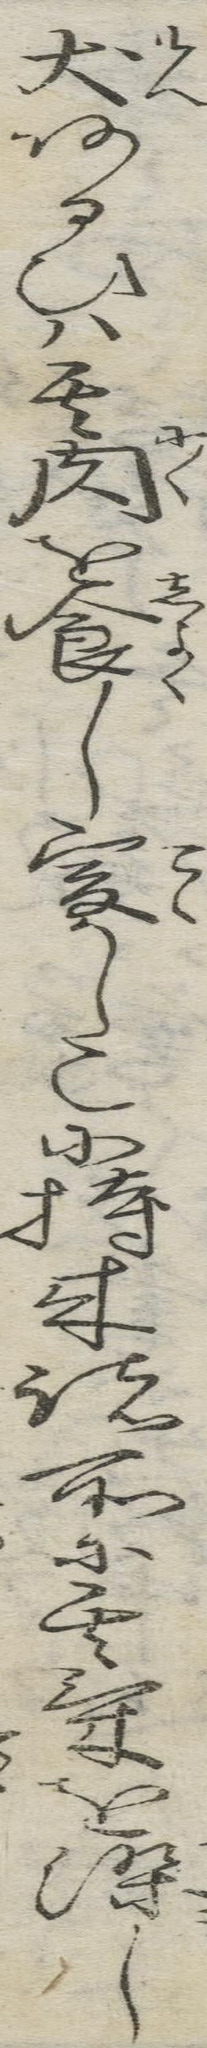犬あるひは其肉を食し爰かしこに持来る所に其気を染し
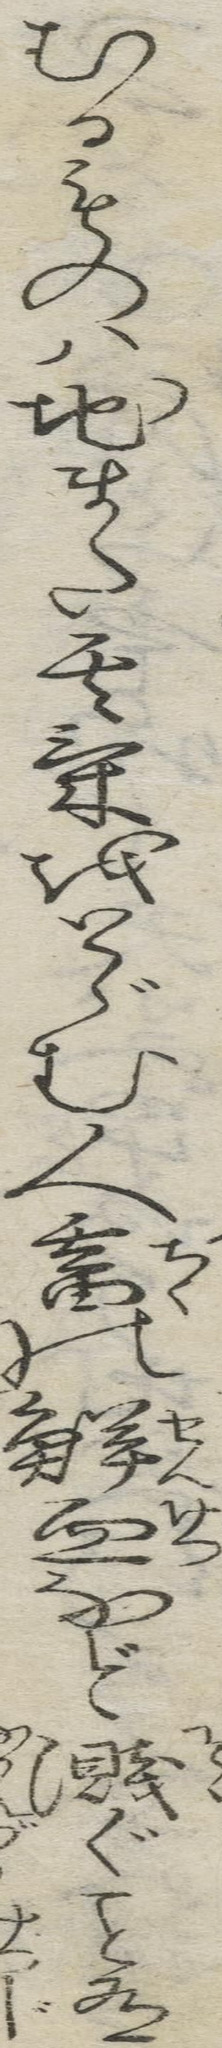むるものは地また其気をとぐむ人畜の鮮血など濺ぐこと有
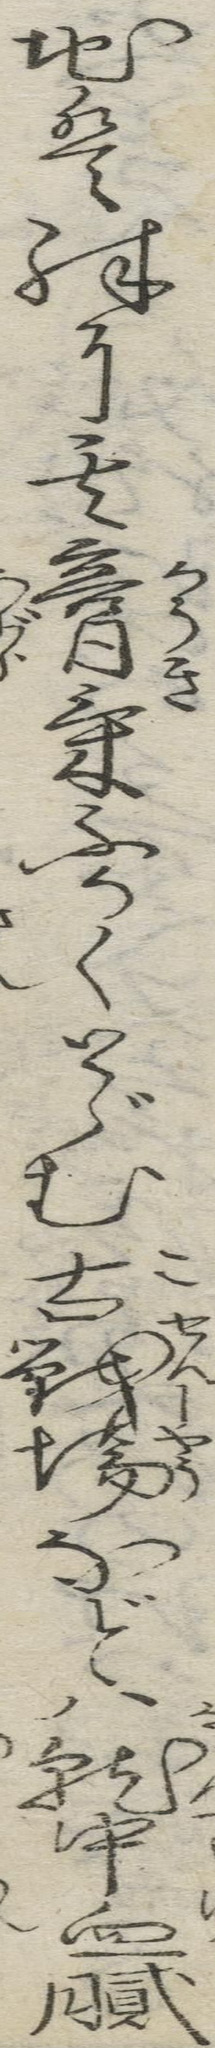地は殊に其膏あぶら気ふかくとぐむ古戦場などは就中血膩
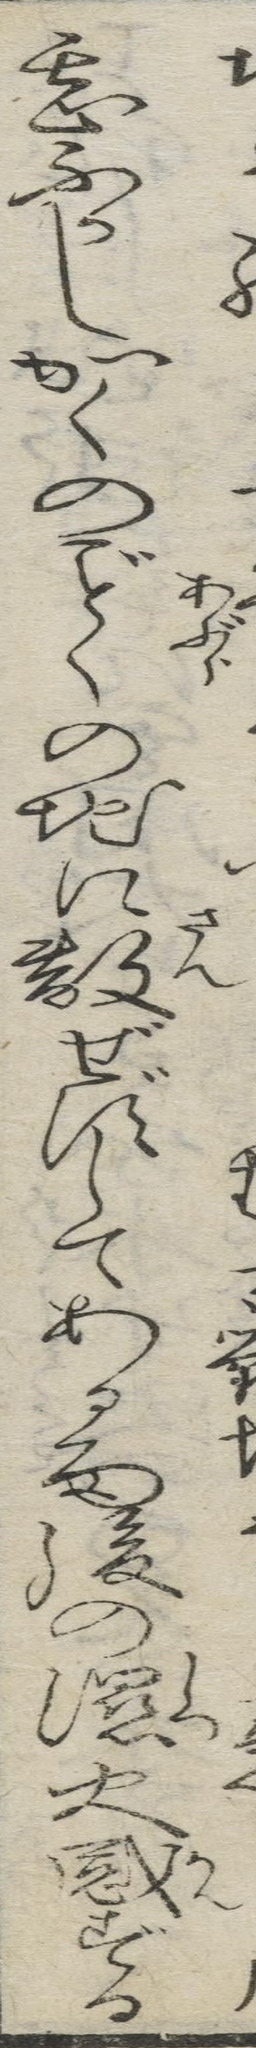甚ふかしかくのごとくの地に散ぜずしてある雨後の湿火感ずる
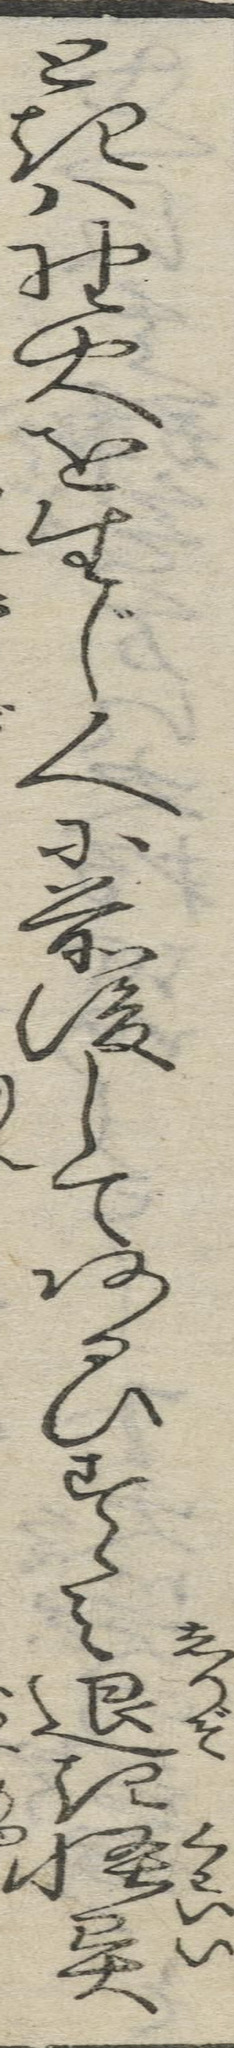ときは性火を生じ人に前後してあるひすくみ退き怪異
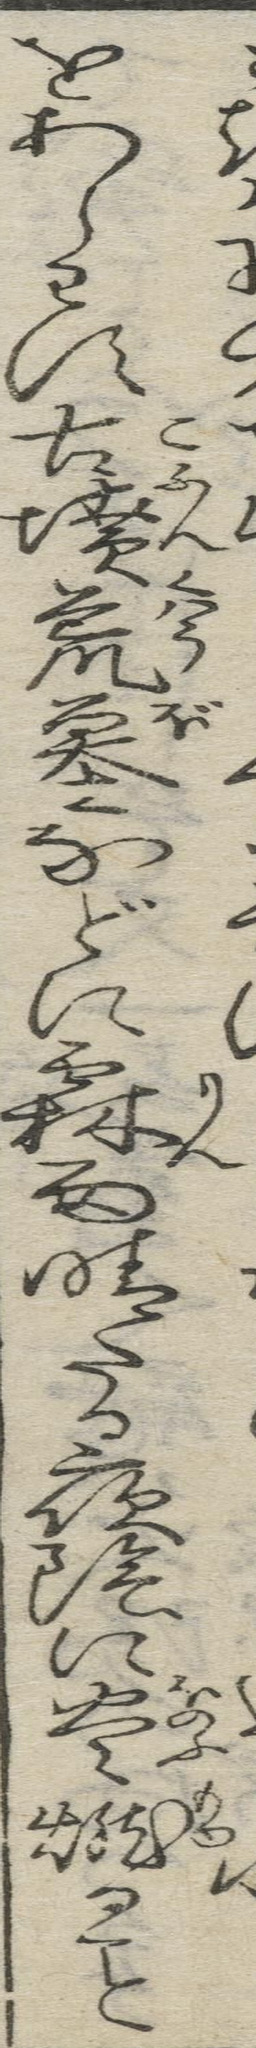をあらわす古墳荒墓などに霖雨晴たる夜陰に炎燃ること
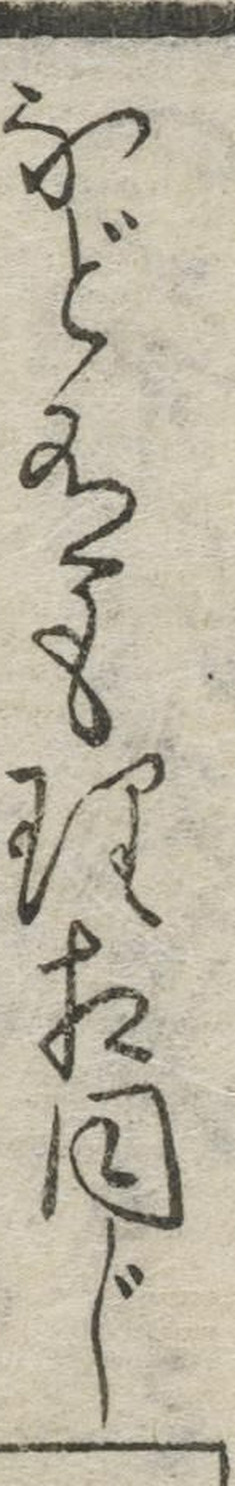など有も理相同じ
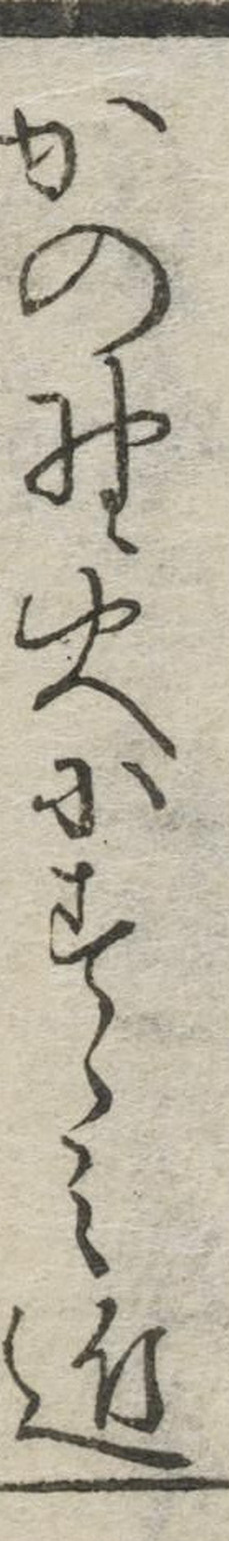かの性火にすくみ近
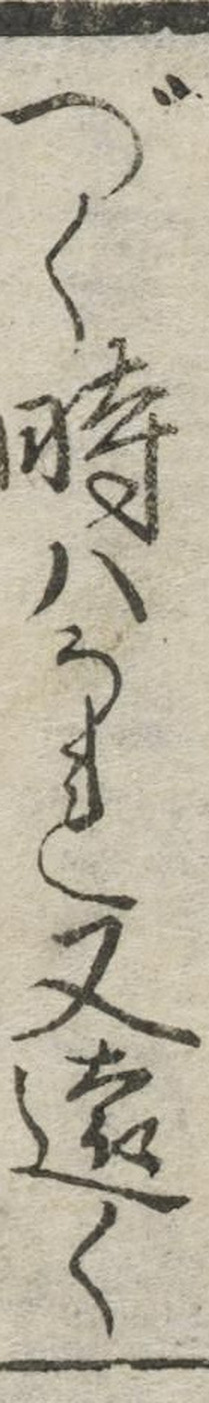づく時はかれ又遠く
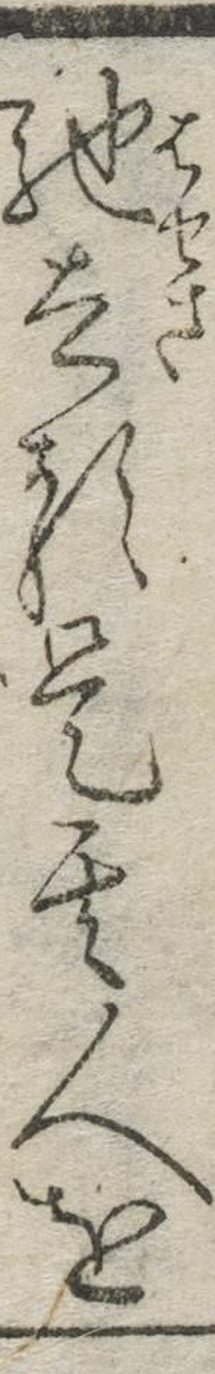馳去る是其人を
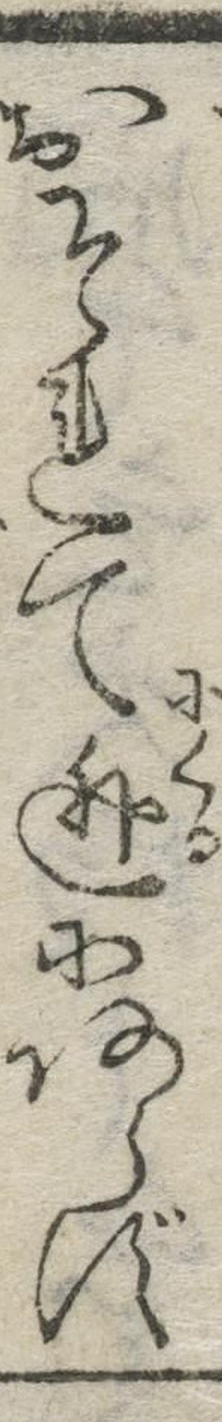おそれて逃にあらず
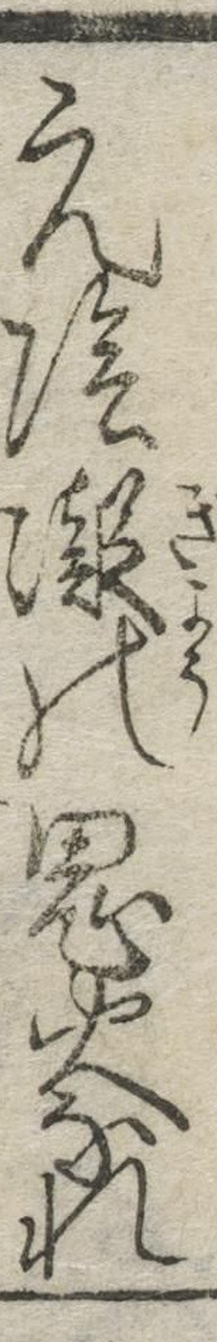元陰凝の鬼火なれ
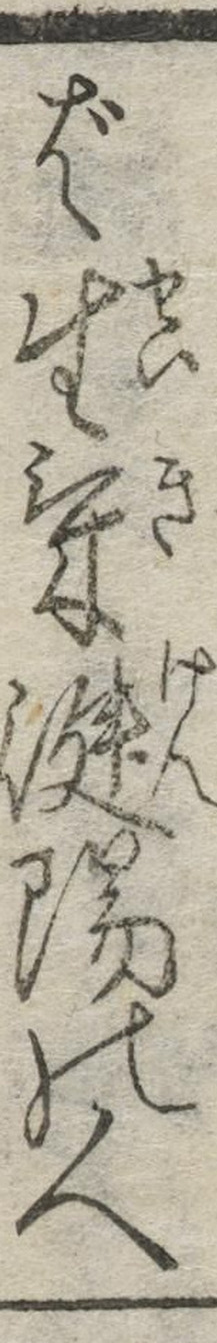ば生気健陽の人
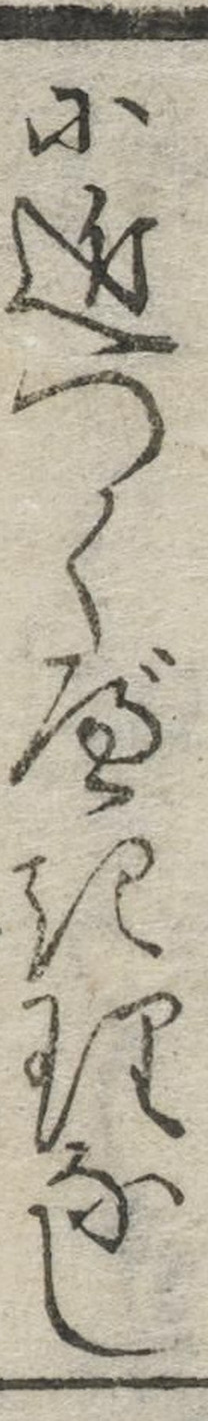に近つくべき理なし
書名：訓蒙天地辨　地
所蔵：東京大学地震研究所図書室 Earthquake Research Institute Library, The University of Tokyo, JAPAN
